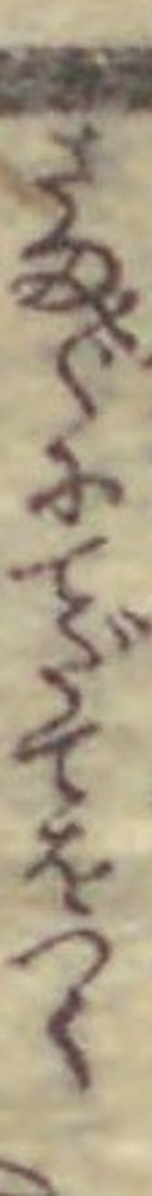さま〴〵にてだてをつく
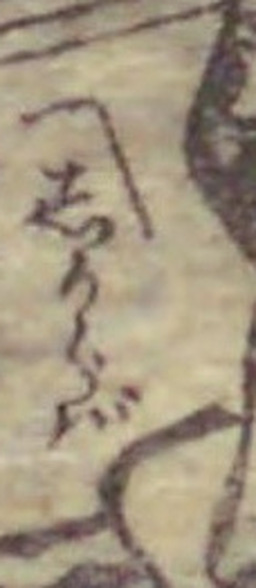〽しからば
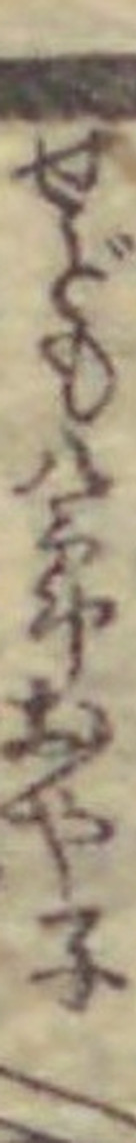せども八郎おや子
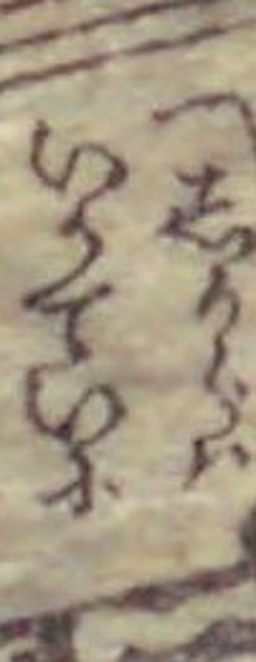いかていに
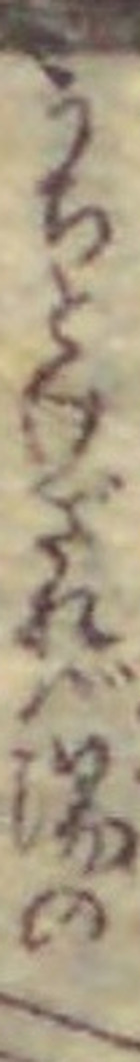うちとけざれば湯の
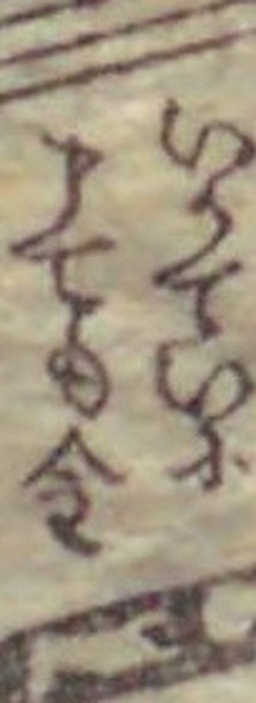申ても金
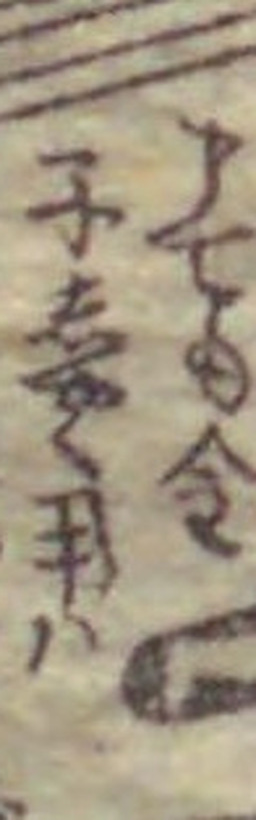子しやく用は
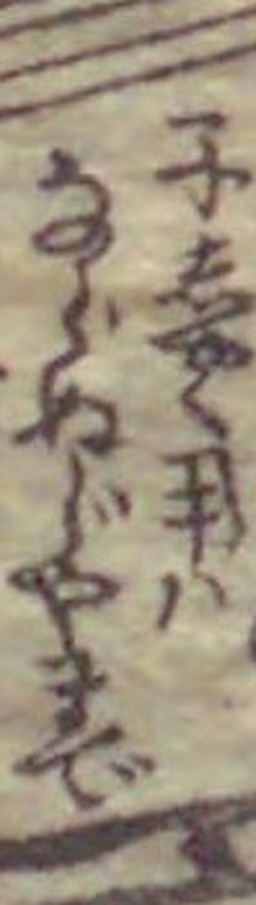ならぬじやまで
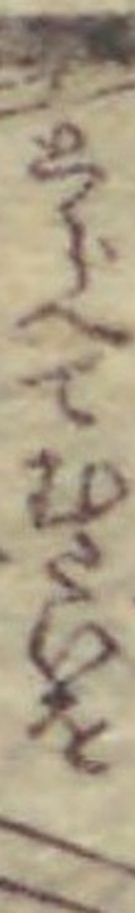とらへてむたいを
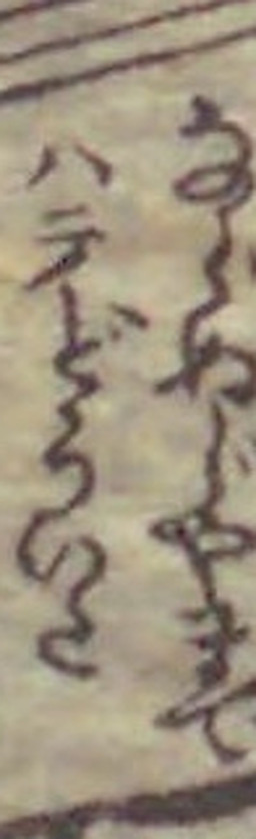ハテどういた
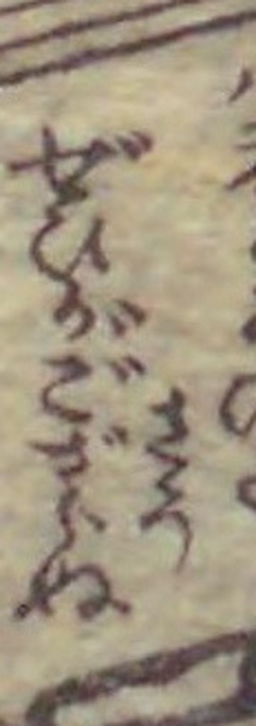ぜひがござらぬ

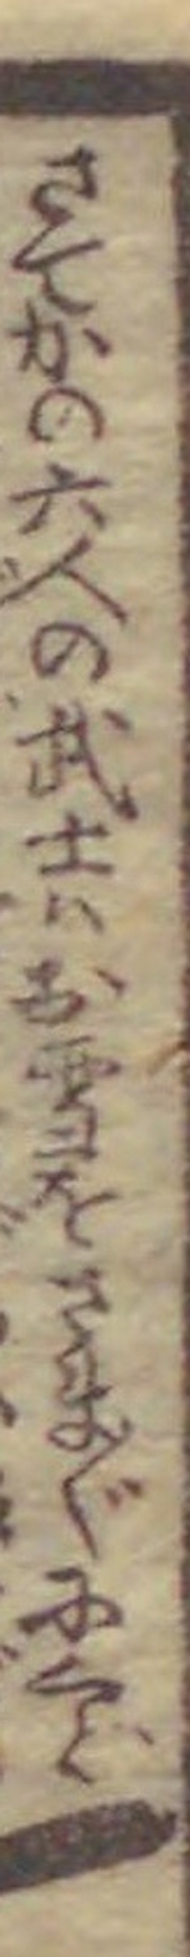さてかの六人の武士はお雪をさま〴〵にくど
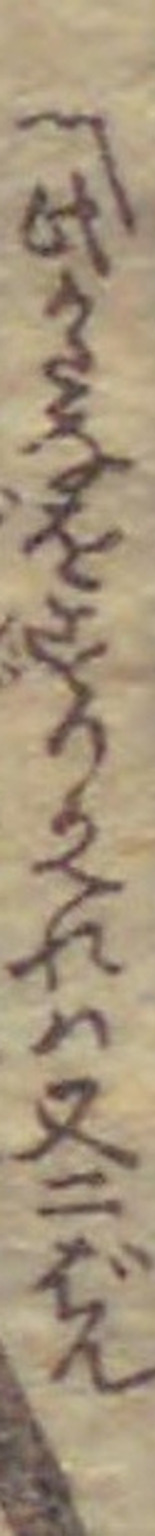〽此かたなをすりかへれは又二ばん
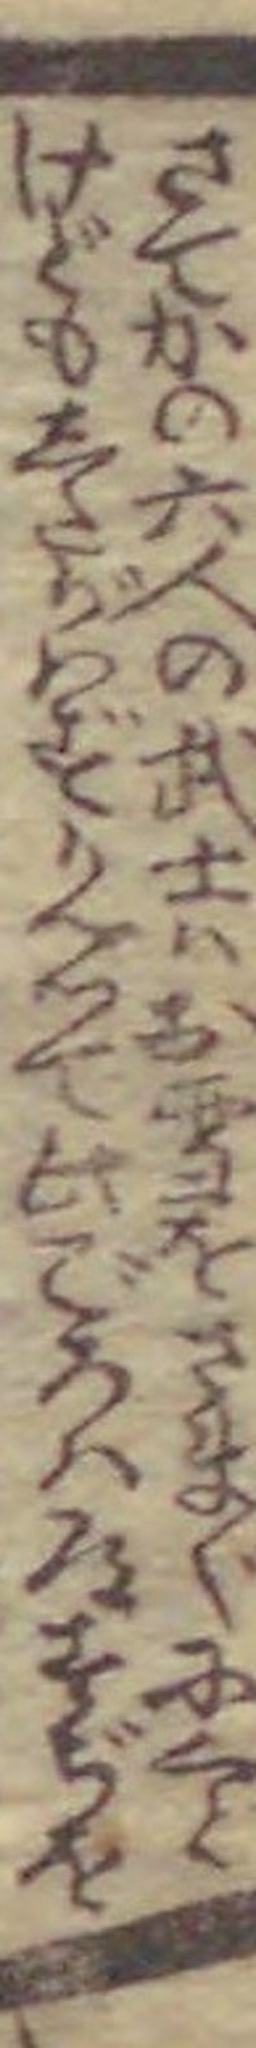けどもしたがはずかへつて此ごろは道すぢを
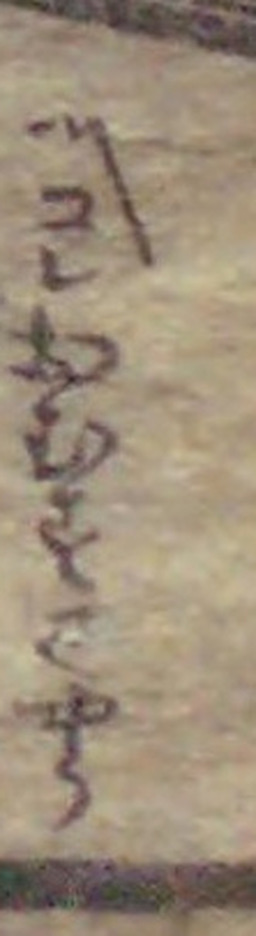〽コレおむすさやう
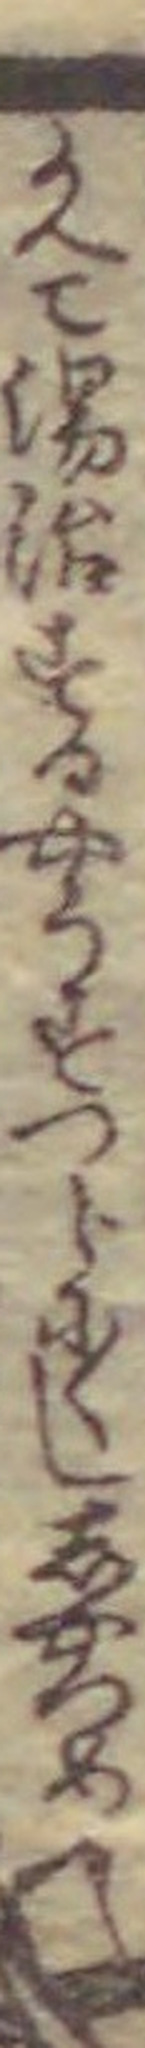かへて湯治するやうすつらにくししやつめ
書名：八ツ目鱣因縁物語 3巻
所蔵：国立国会図書館 National Diet Library, JAPAN
